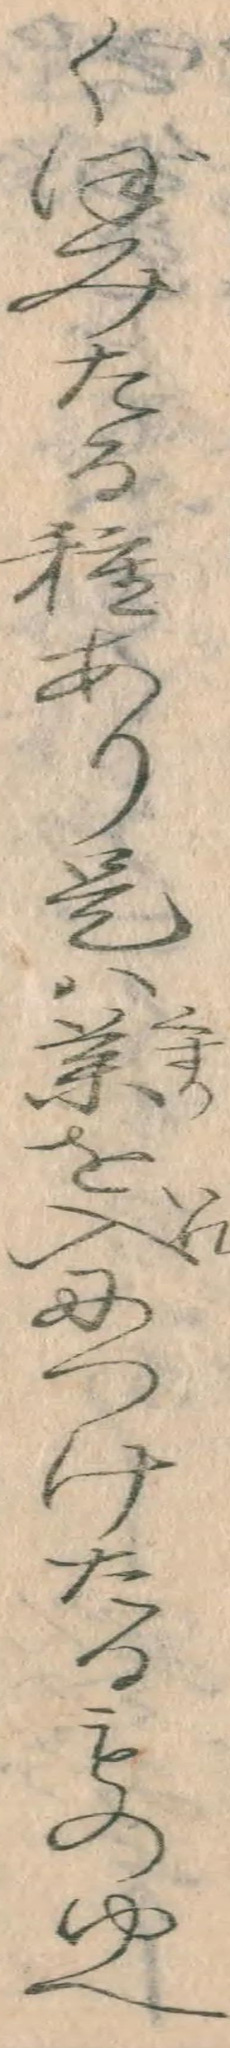くぼみたる種あり是は薬を入につけたるものゆへ
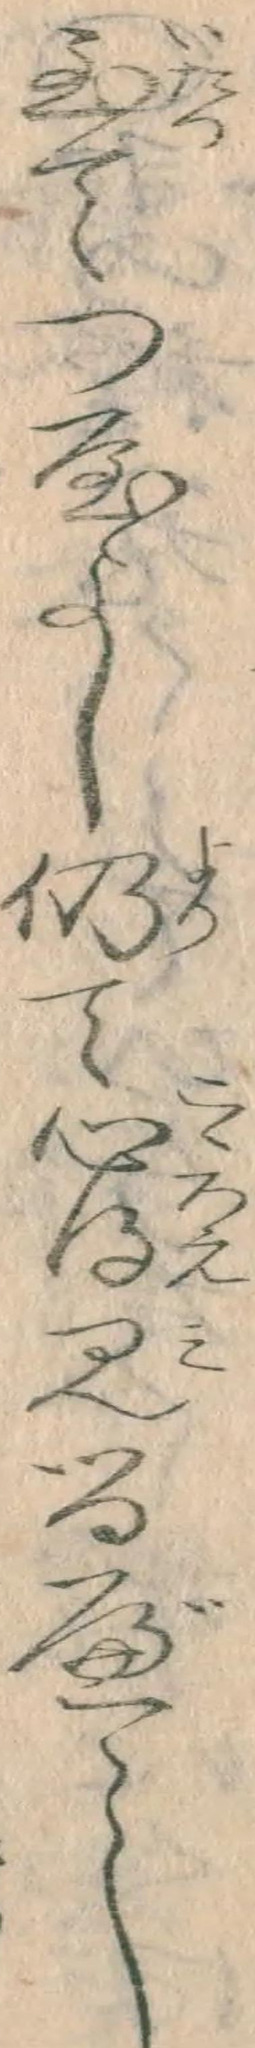至てつやよし仍て心得見るべし
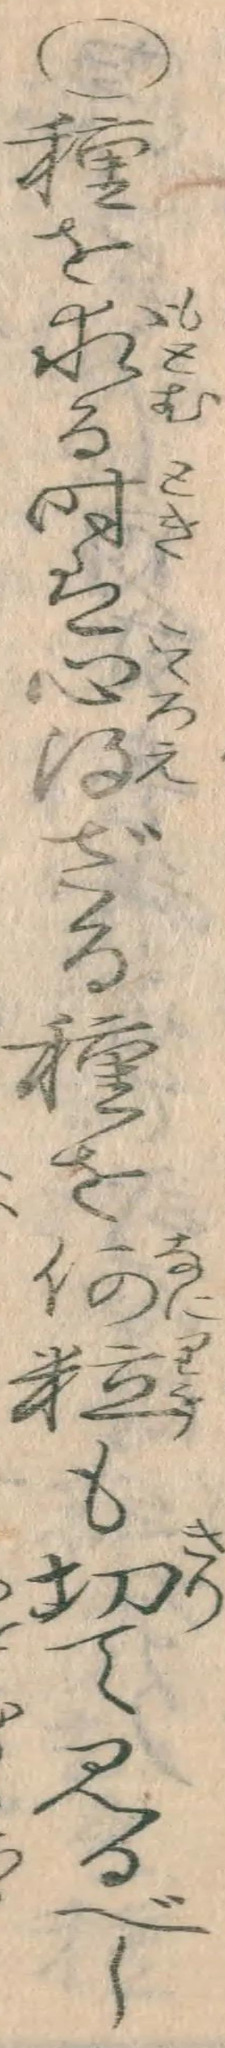○種を求る時は心得ざる種を何粒も切て見るべし
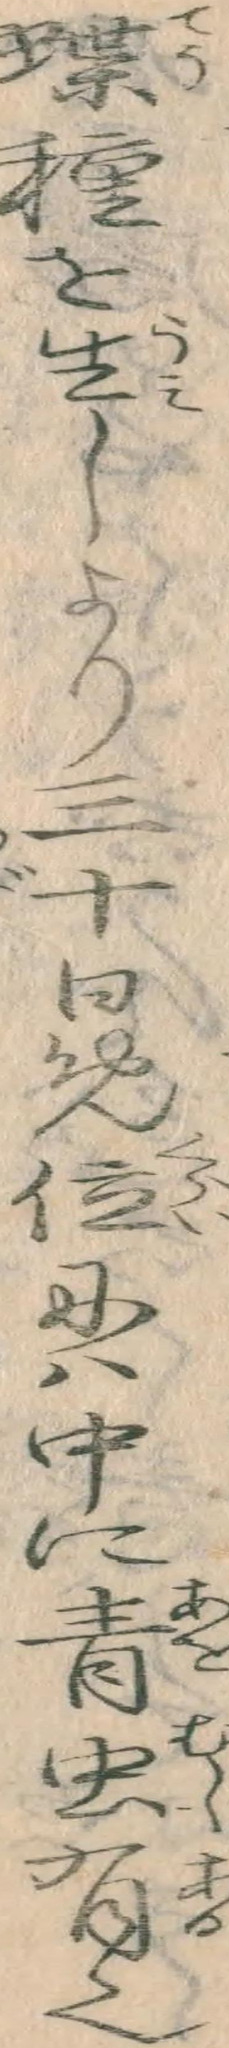蝶種を生しより三十日め位には中に青虫有也
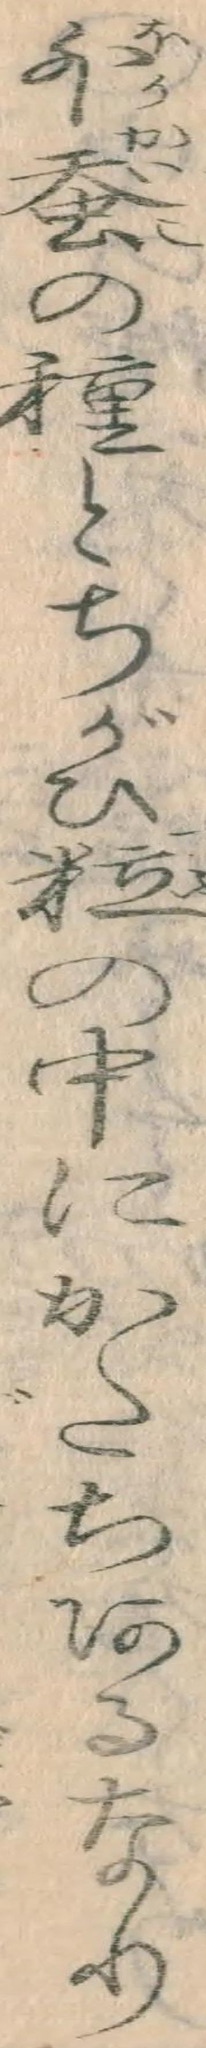外蠶の種とちがひ粒の中にかたちあるなり
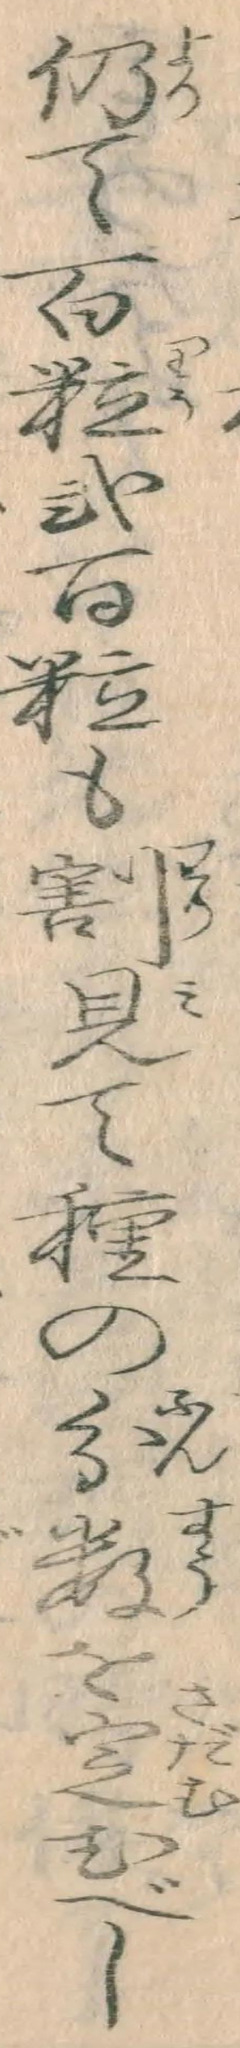仍て百粒弐百粒も割見て種の分数を定むべし
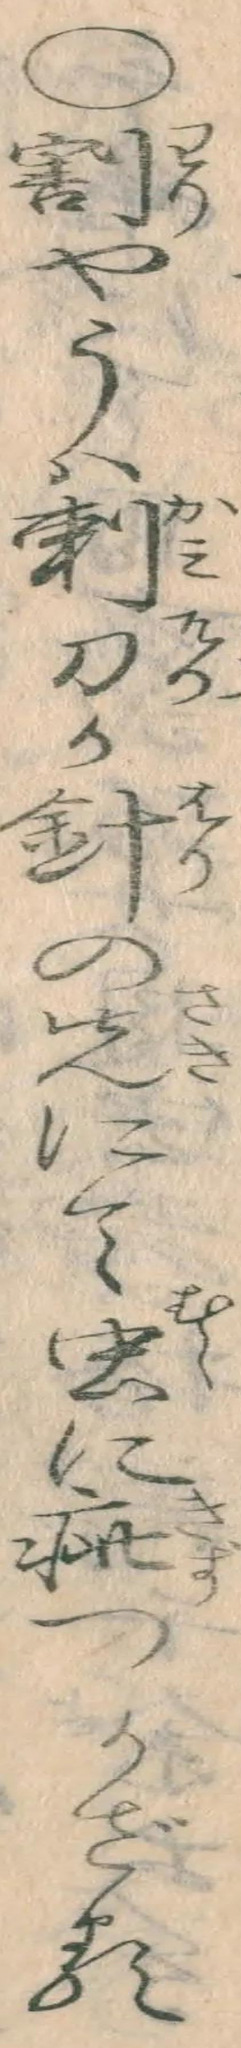○割やうは刺刀か針の先にて虫に疵つかざる
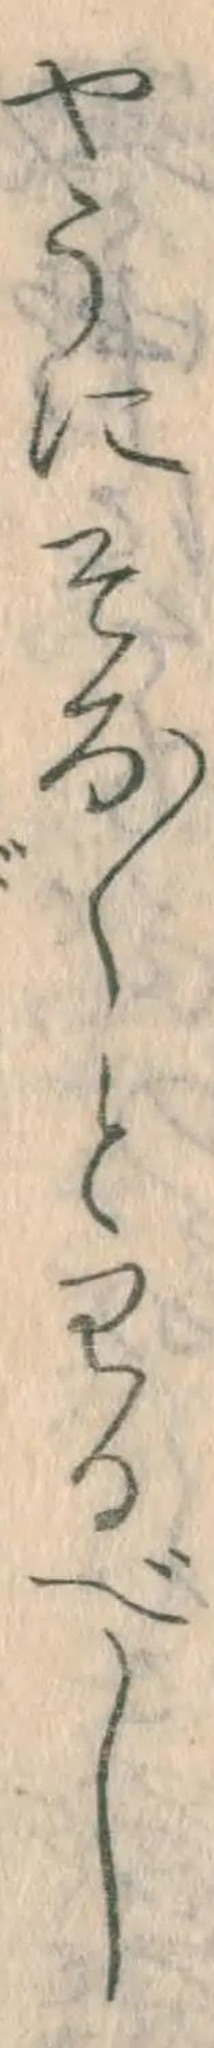やうにそろ〳〵とわるべし
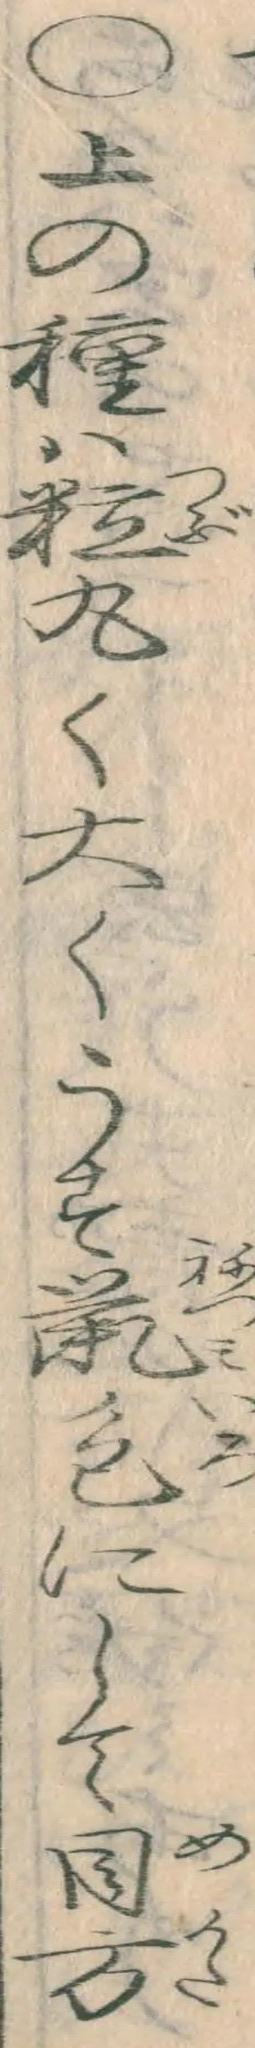○上の種は粒丸く大くうす鼠色にして目方

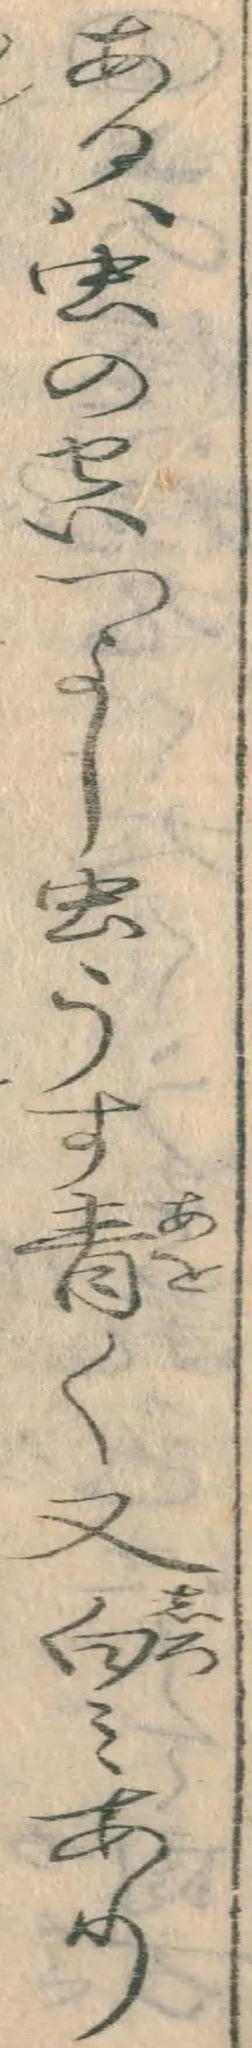あるは虫のせいつよし虫うす青く又白みあり
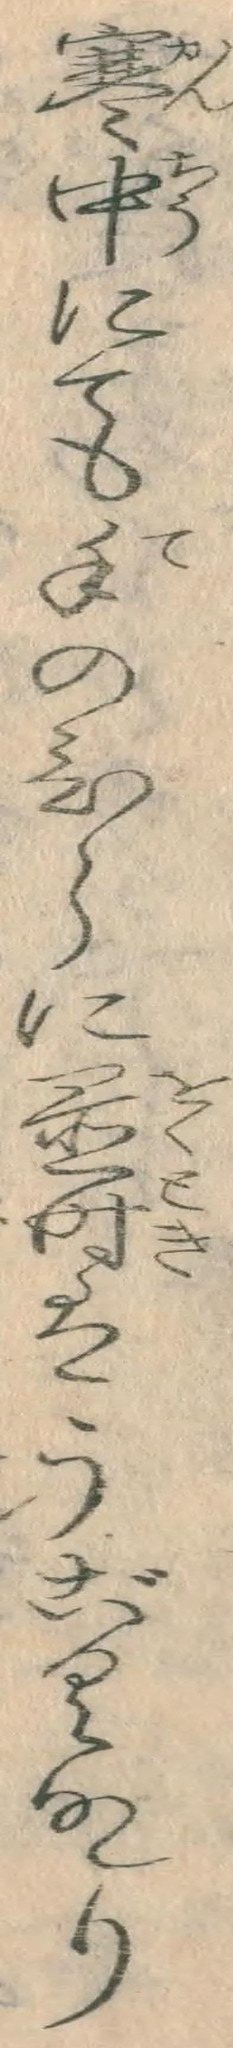寒中にても手のひらに置時はうごくなり
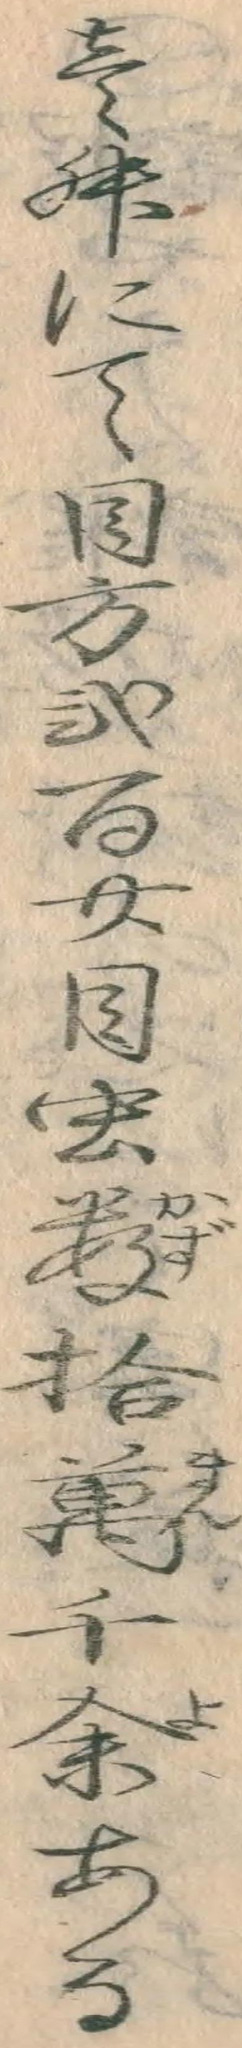壱升にて目方弐百廿目虫数拾萬千余ある
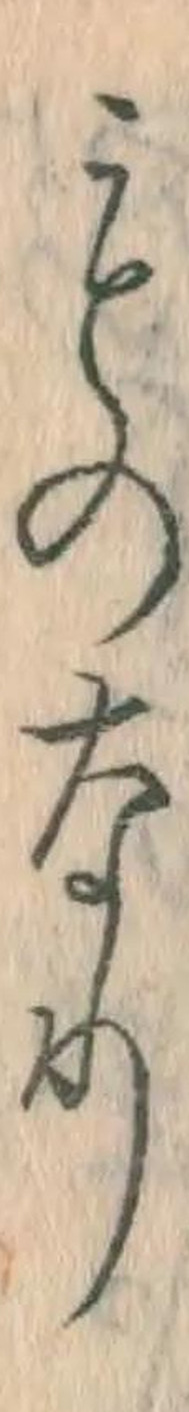ものなり
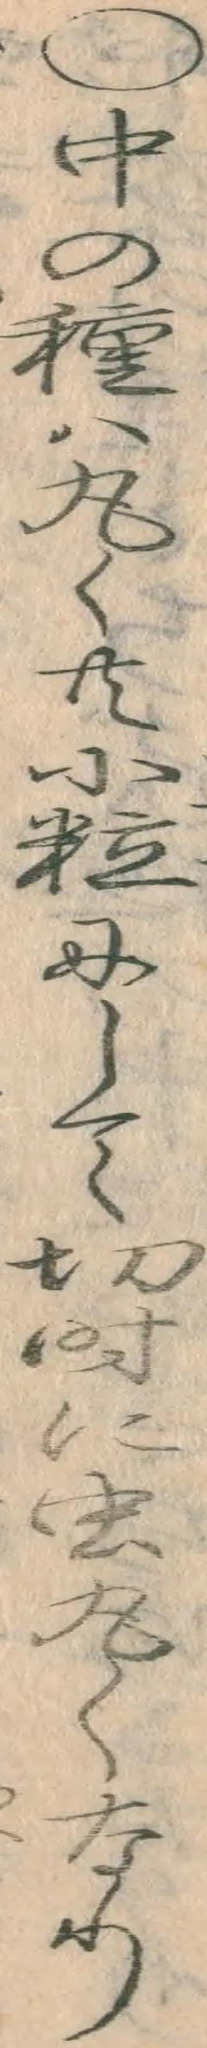○中の種は丸く共小粒にして切時に虫丸くなり
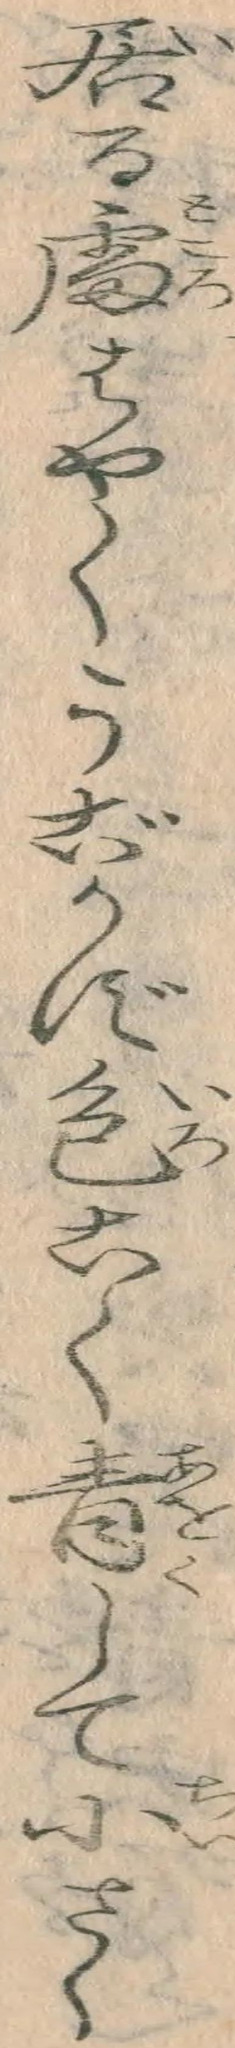居る處はやくうごかず色こく青して小さく
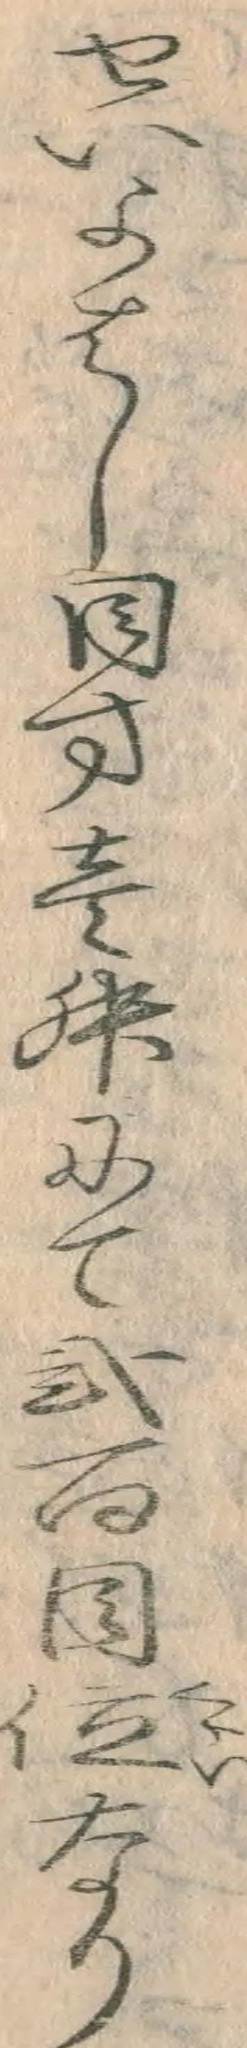せいよはし目方壱升にて弐百目位なり
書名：山繭養法秘傳抄
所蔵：国立国会図書館 National Diet Library, JAPAN
